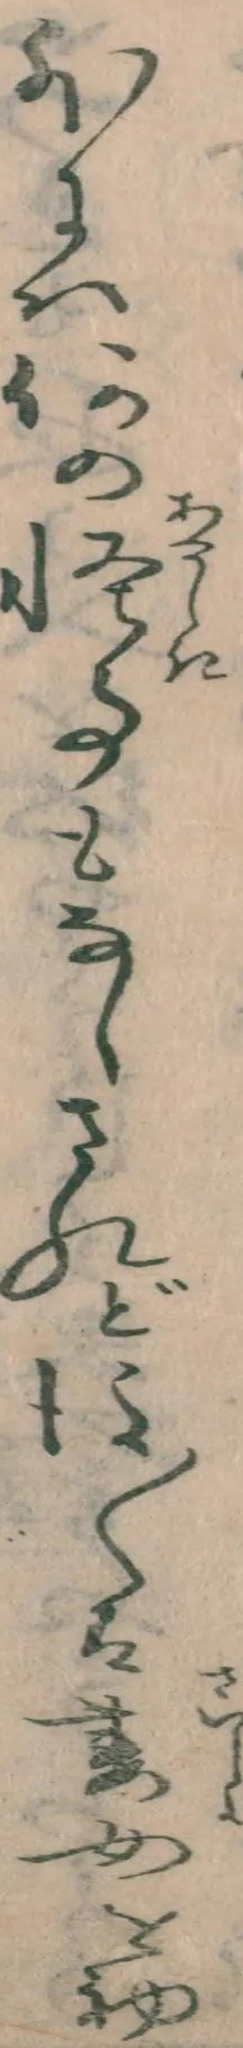外には何の怪事もなしされど後〳〵は妻女を初
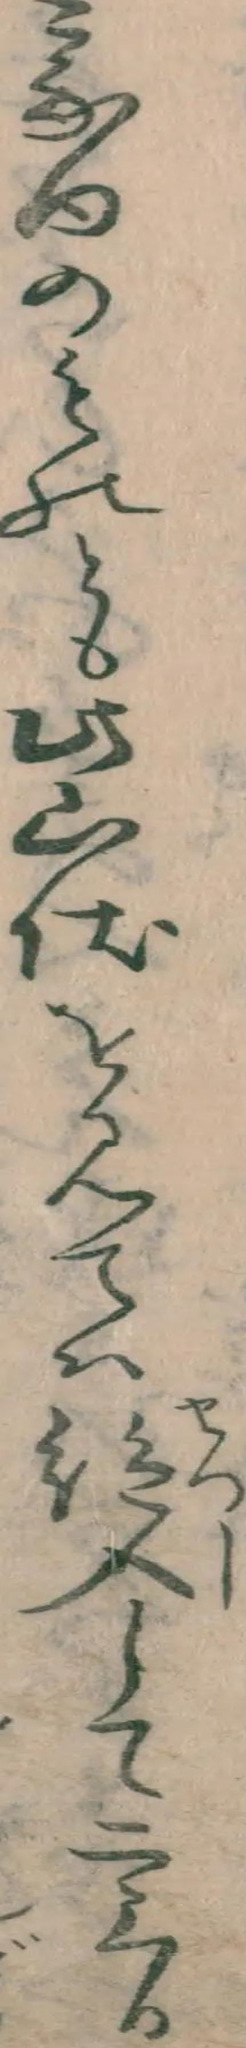家内のものとも此山伏を見ては絶入して二三日
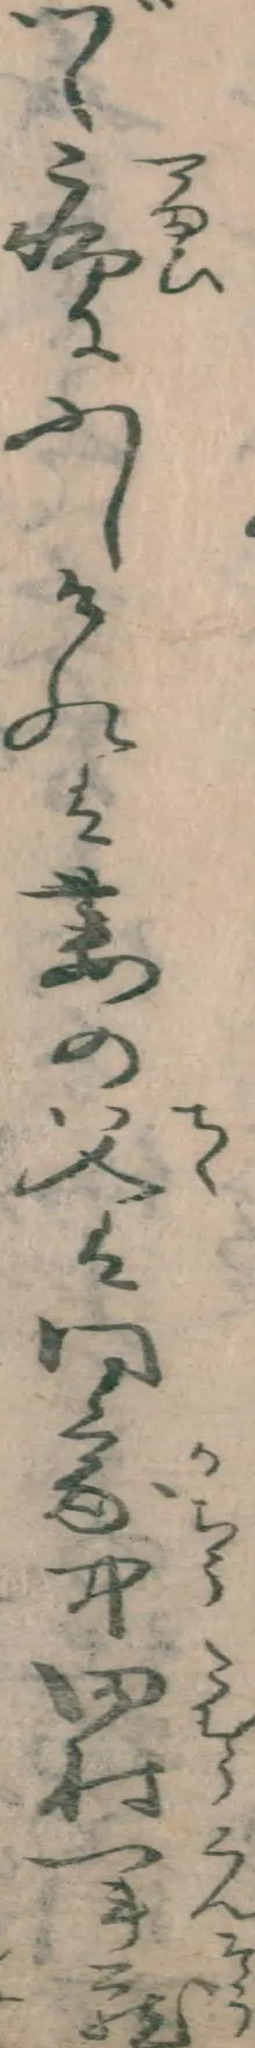づゝ病にふしけれは妻の父は同家中田村軍蔵
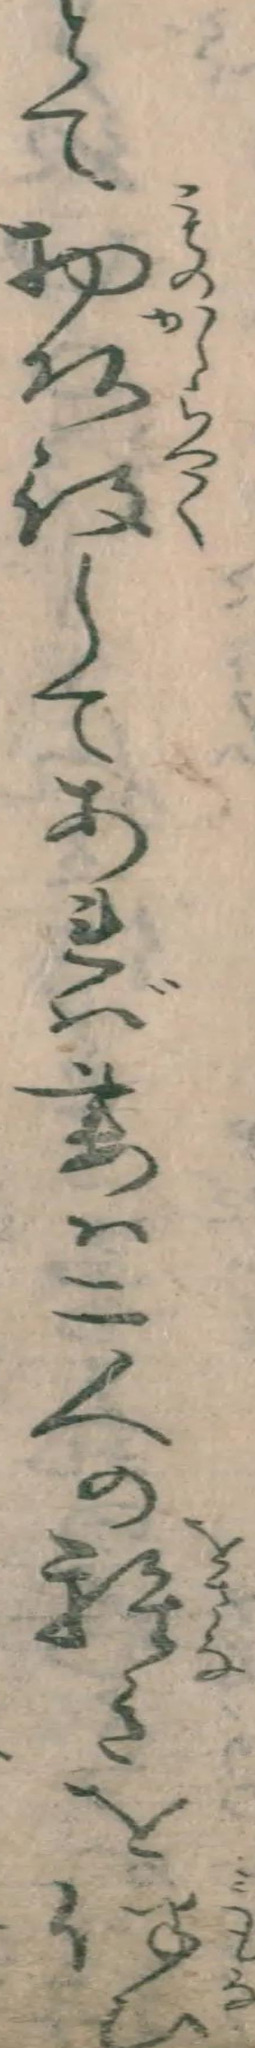とて物頭役してあれば妻は二人の稚きを伴ひ
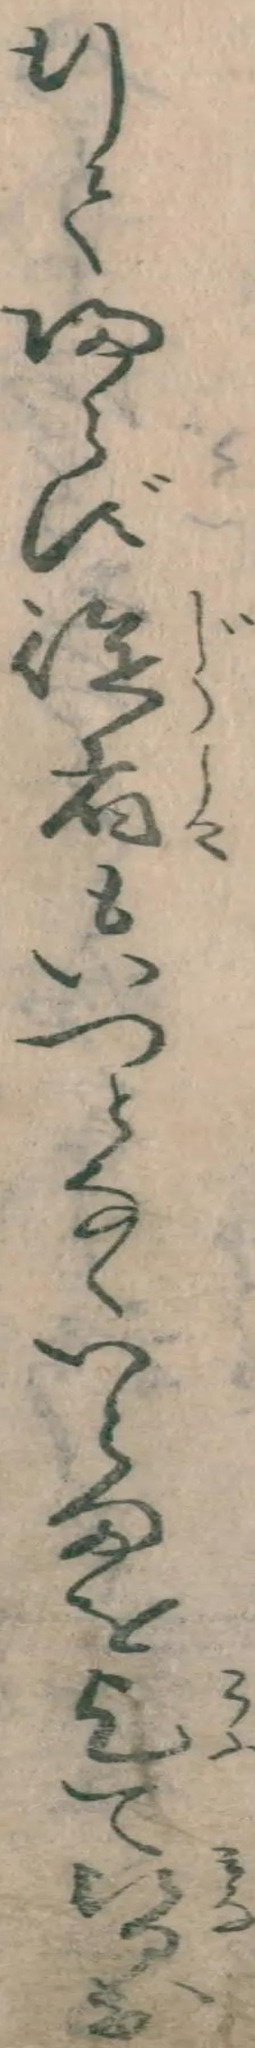行て帰らず従者もいつとなくいとまを乞て皆出
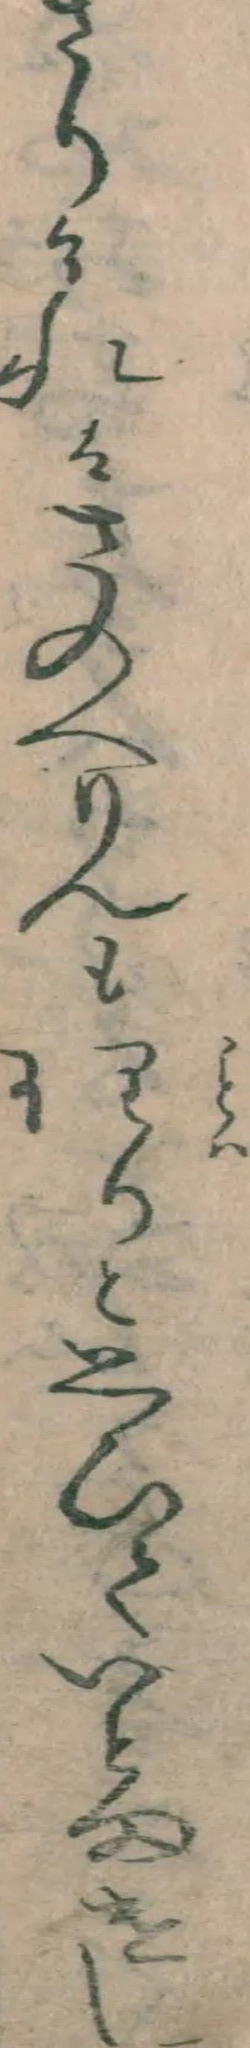さりけれはさのへもんも理りと思ひていとま遣し

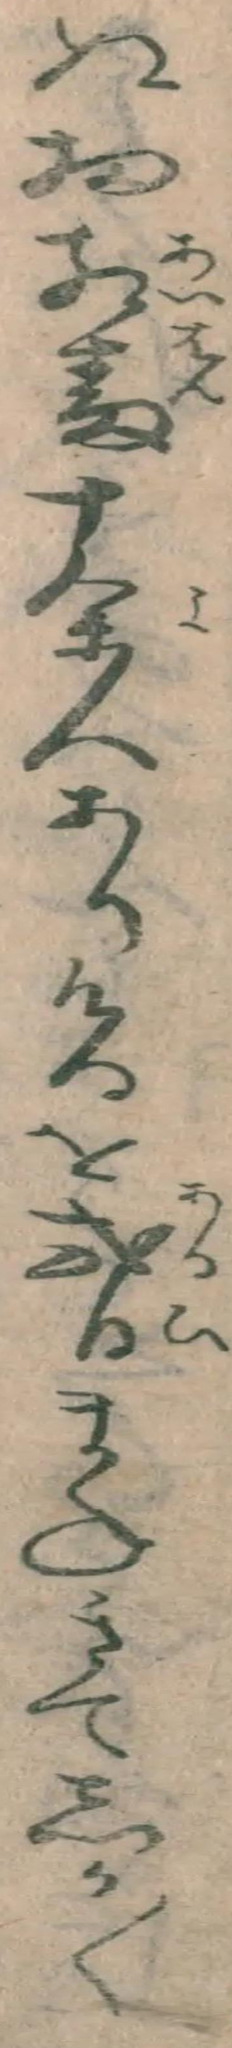ぬ扨相番十余人ありけるを或日まねきてしか〳〵
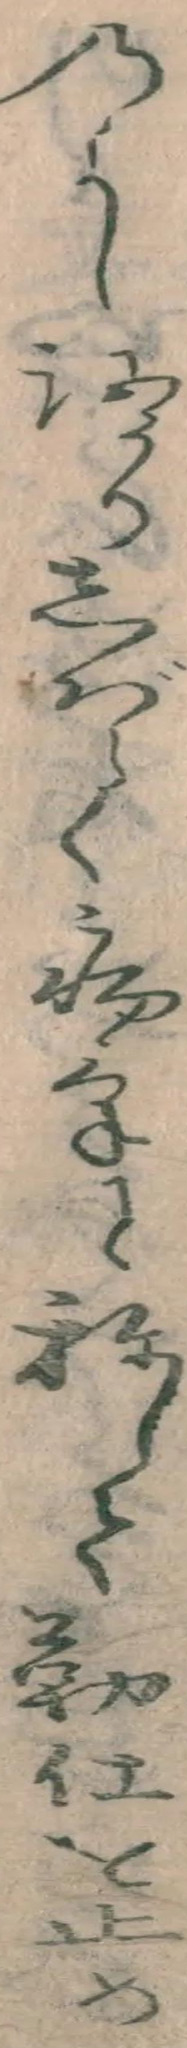のよし語りしばらく病気と称して勤仕を止め
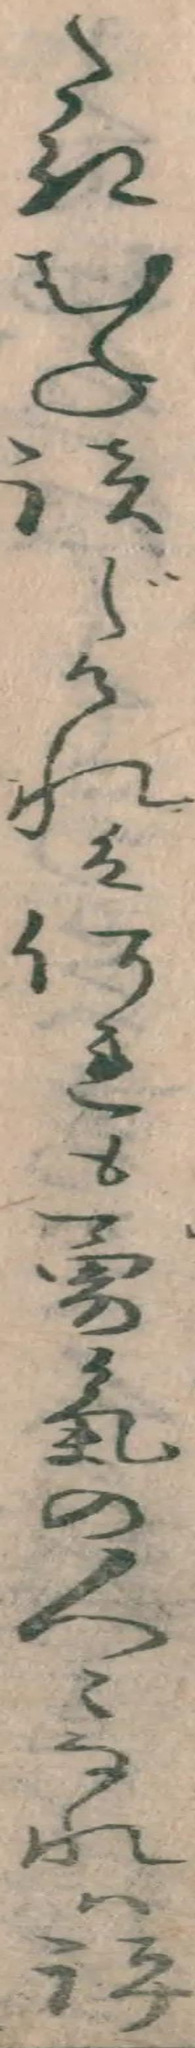たきむね談じけれは何れも勇気の人々なれは評
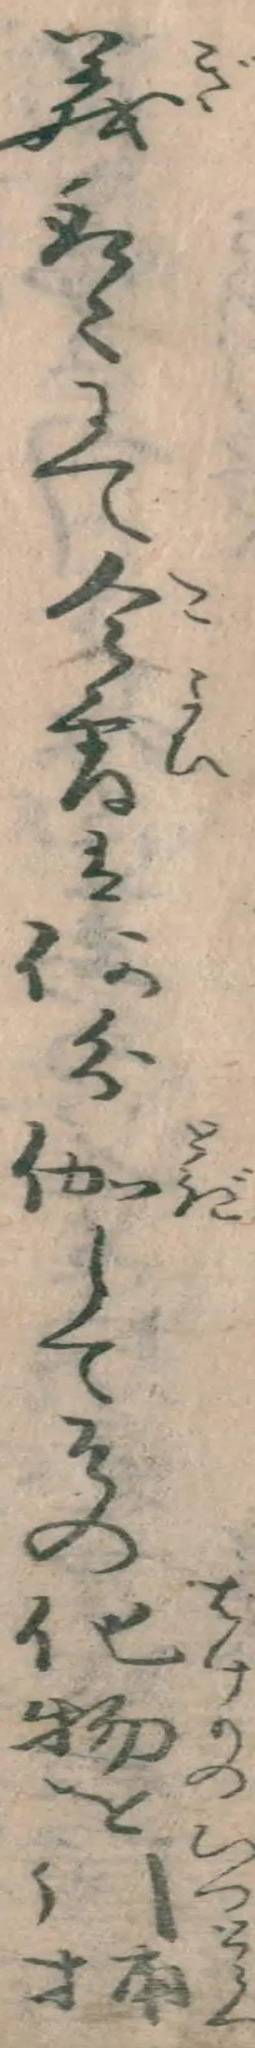義取々にて今宵は何分伽してその化物を引捕
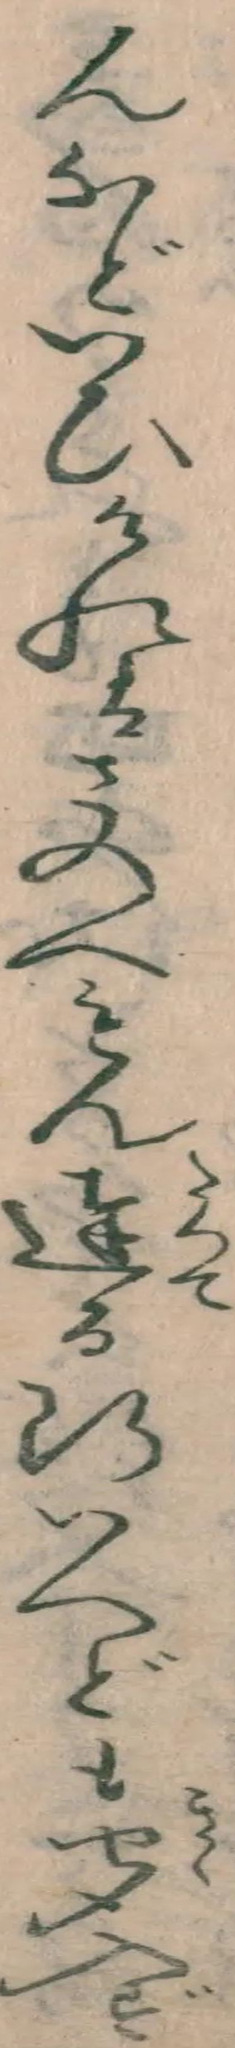んなどひきけれはさのへもん達る？断？いへとも聞入ず
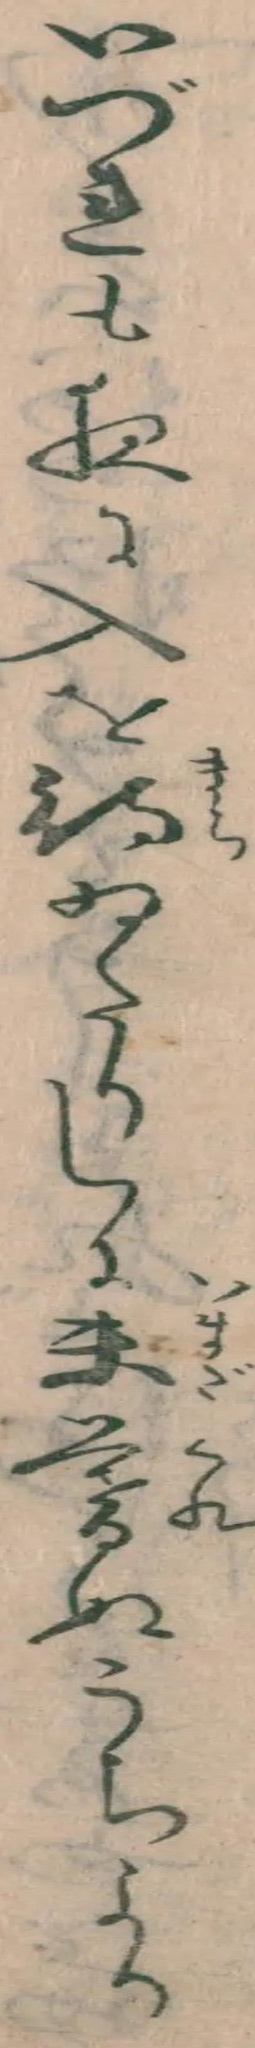いづれも夜に入を待ゐたりしに未暮ぬうちより
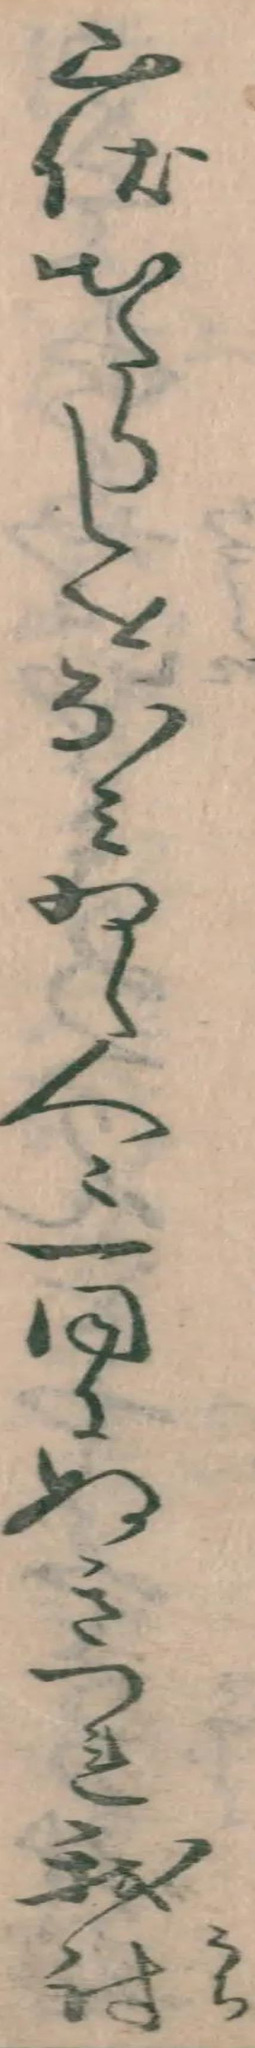山伏出たりしをなみゐし人々一同ににきつれ我討
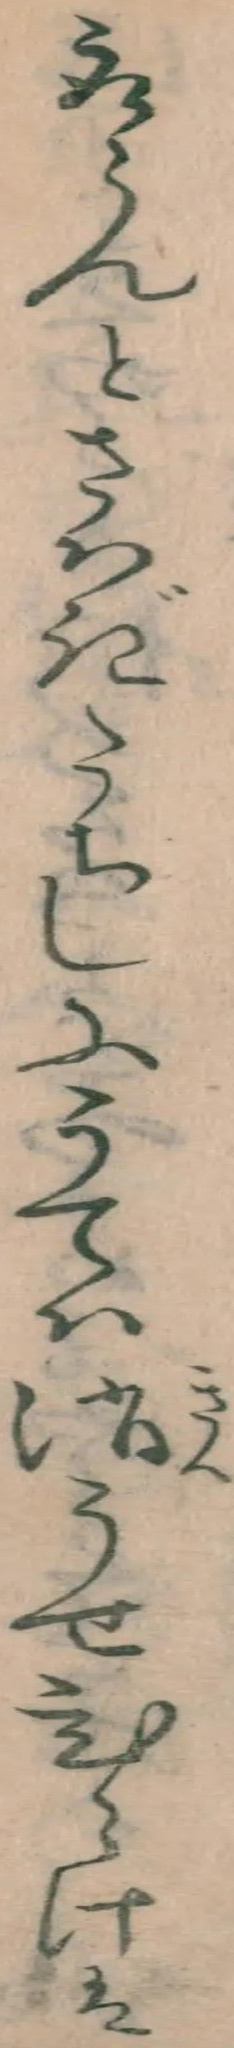取らんとさはぎたちしにうては消うせひらけは
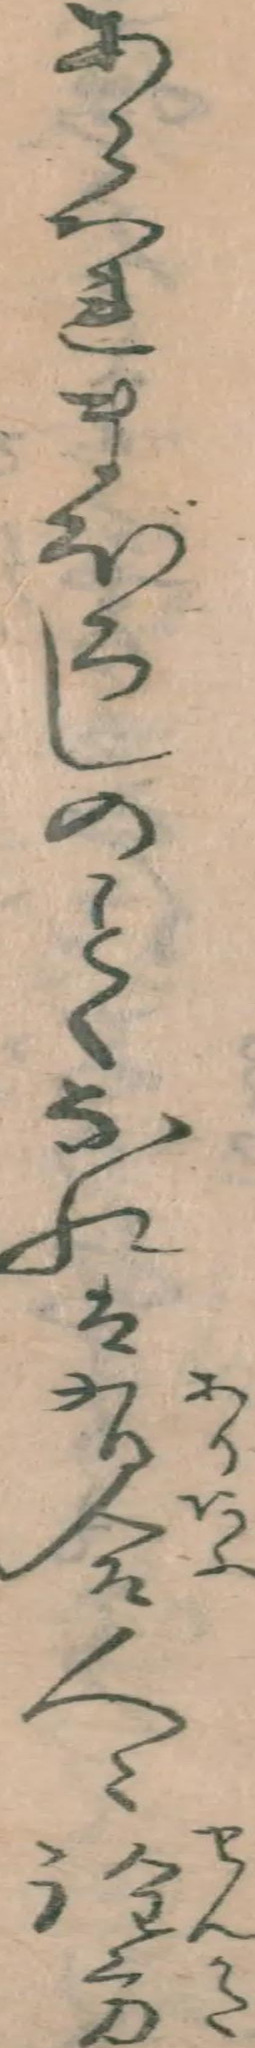あらはれまぼろしのことくなれは有合人々詮方
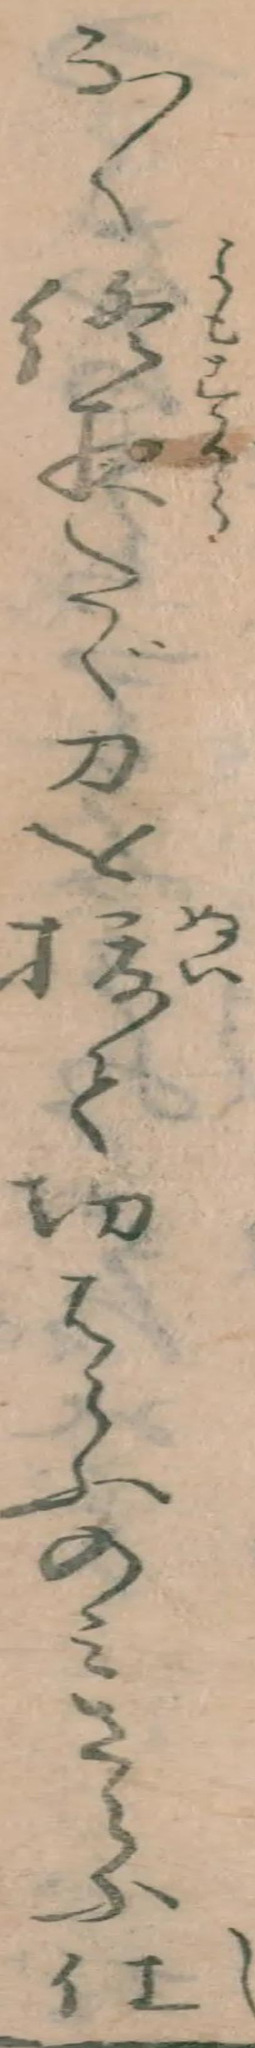なく終夜たゞ刀を抜て切はらふのみさらに仕
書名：怪談御伽童 5巻. [2]
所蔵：国立国会図書館 National Diet Library, JAPAN
